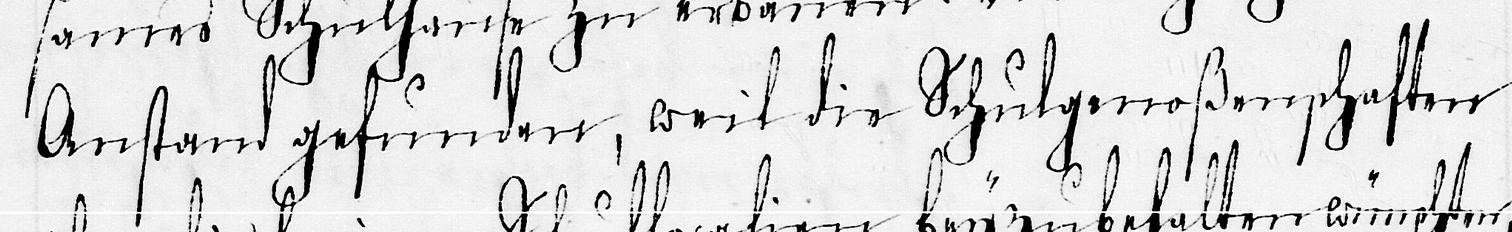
Anstand gefunden, weil die Schulgenoßenschaften
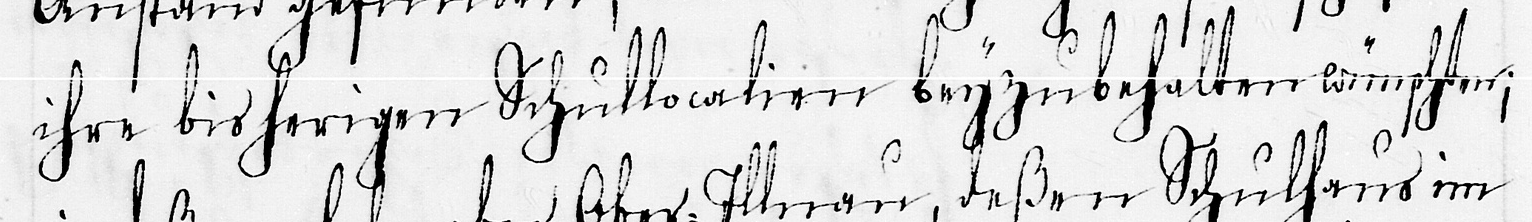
ihre bisherigen Schullocalien beyzubehalten wünschten;
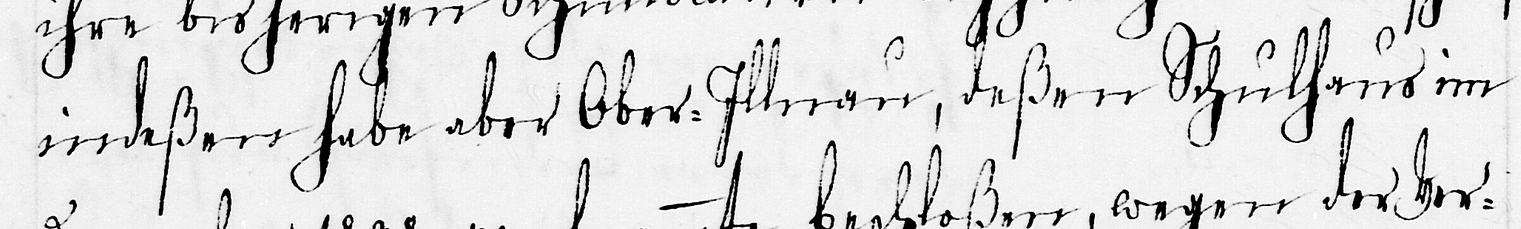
indeßen habe aber Ober-Illnau, deßen Schulhaus im
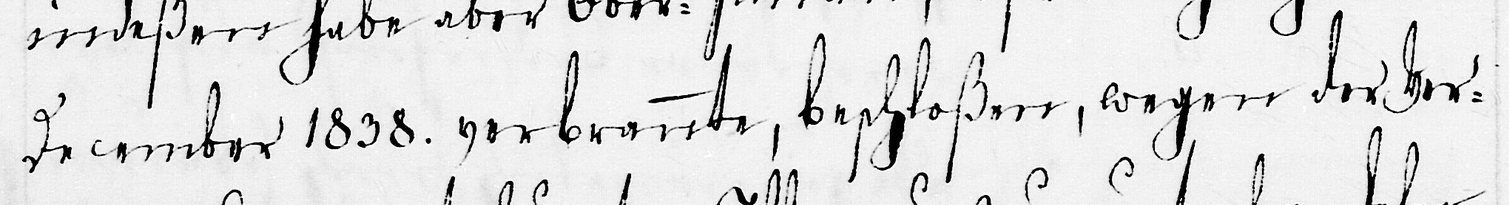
December 1838. verbrannte, beschloßen, wegen der Ver¬
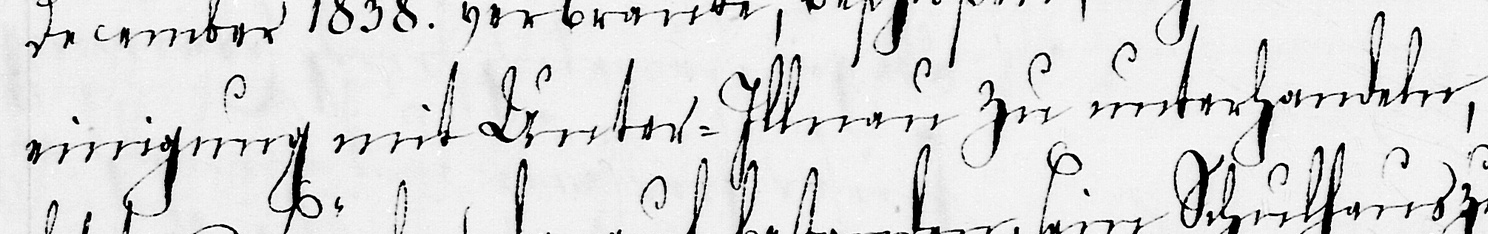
einigung mit Unter-Illnau zu unterhandeln,
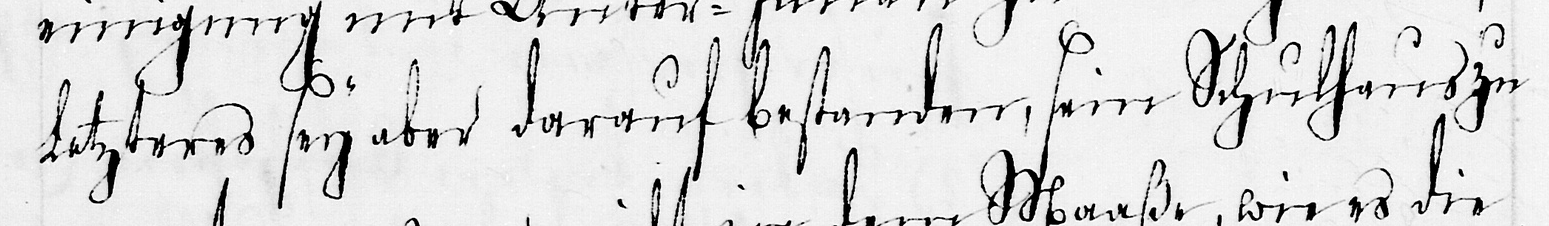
Letzteres sey aber darauf bestanden, sein Schulhaus zu
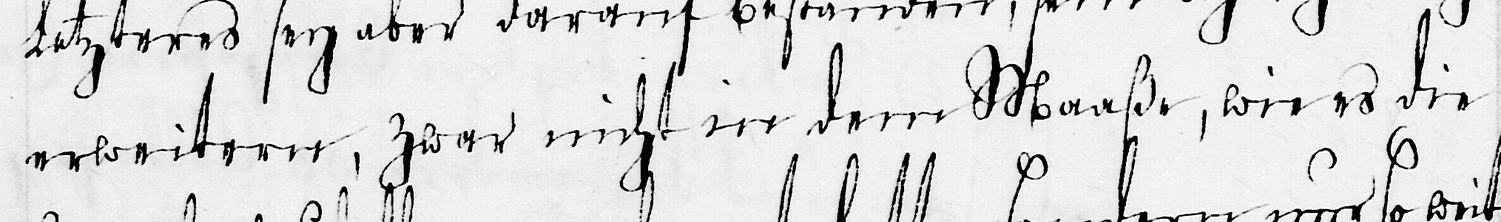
erweitern, zwar nicht in dem Maaße, wie es die
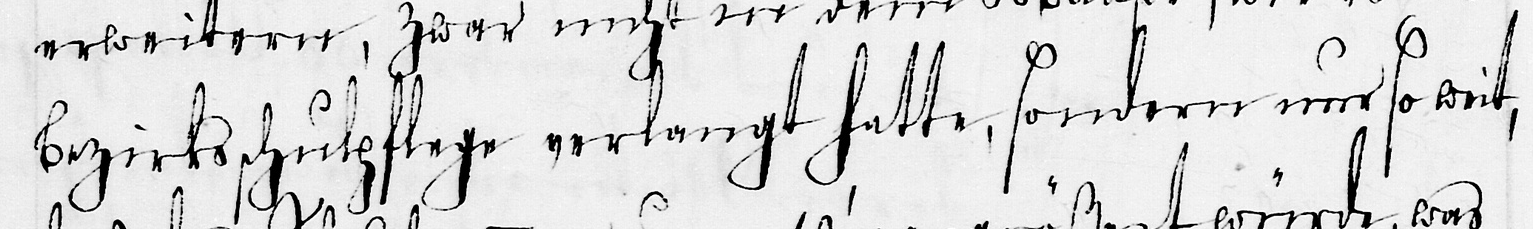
Bezirksschulpflege verlangt hatte, sondern nur so wei¬
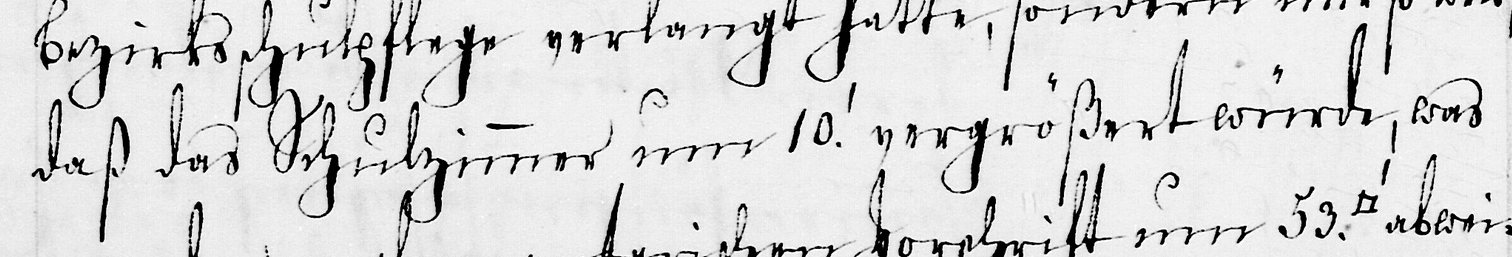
daß das Schulzimmer um 10.‘ vergrößert würde, was
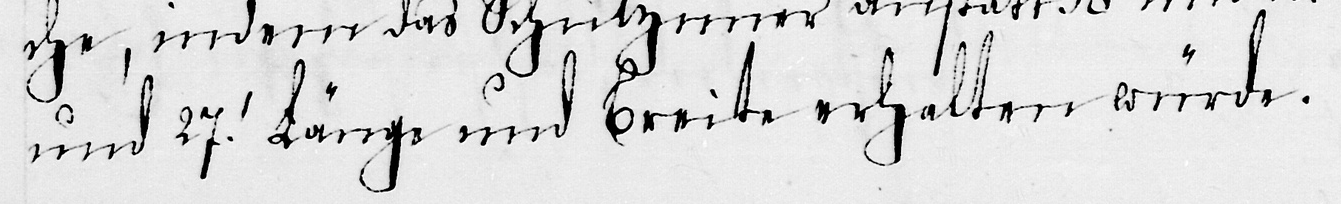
und 27.‘ Länge und Breite erhalten würde.
